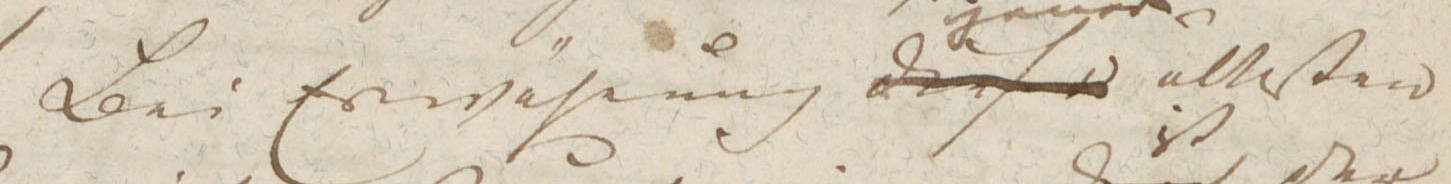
%Bei Erwähnung dieser jener öltesten
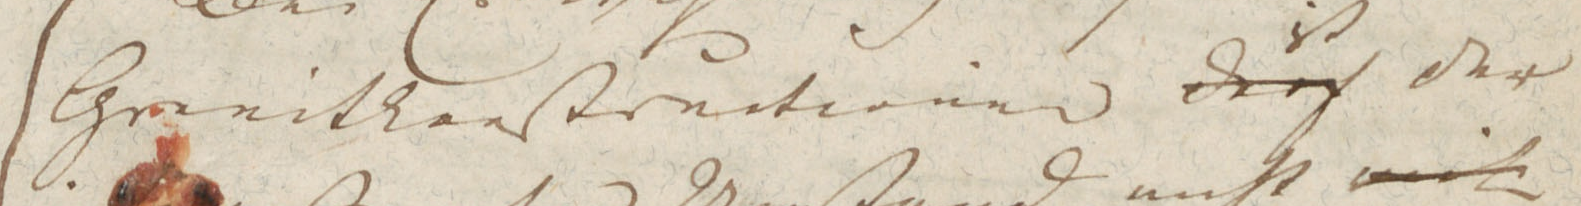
Granitkonstructionen darf ist der
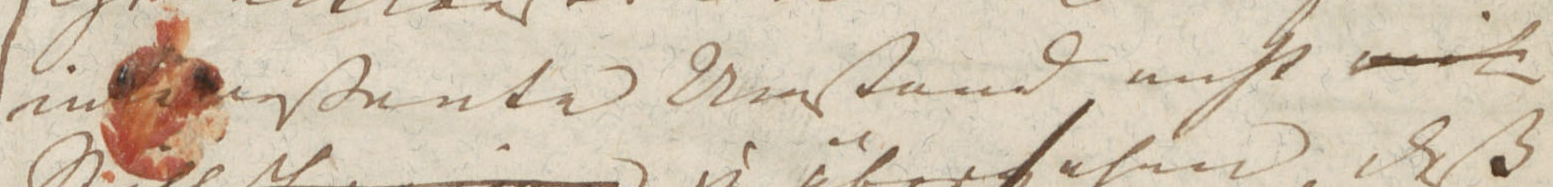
interessante Umstand nicht mit
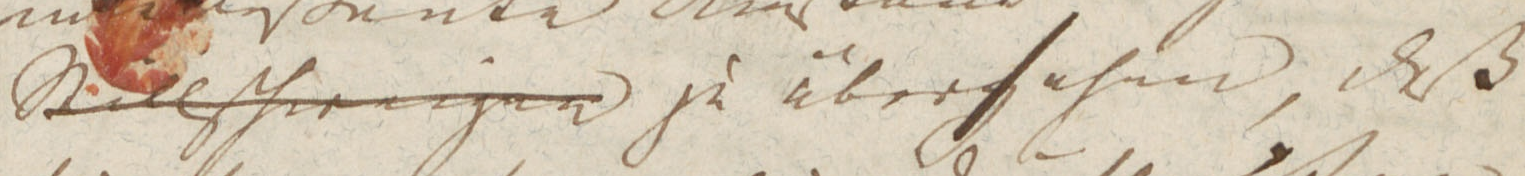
Stillschweigen zu übergsehen, dass
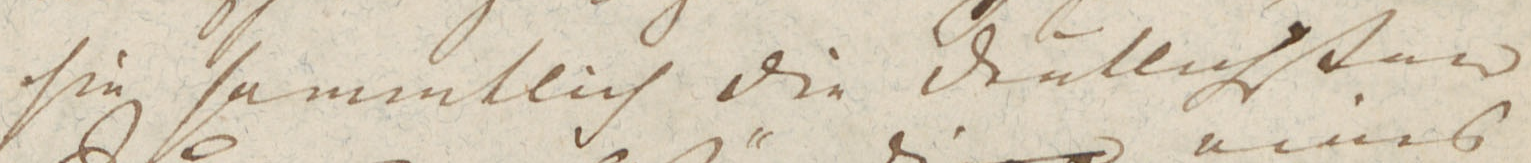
sie sammtlich die deutlichsten
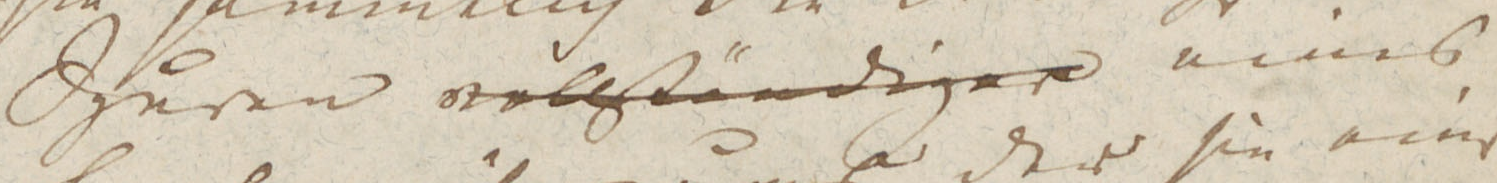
Spuren vollständiger eines
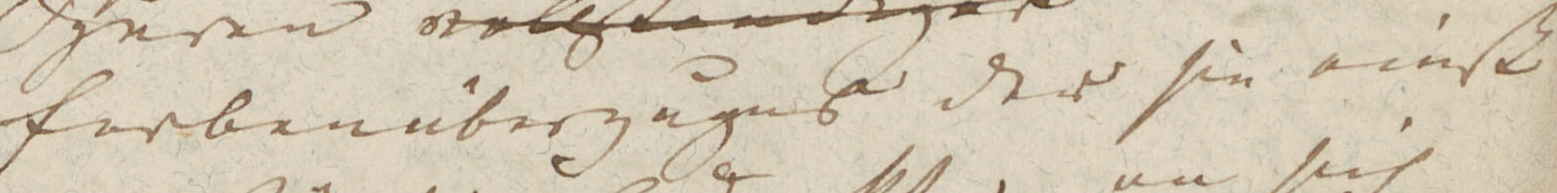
Farbenüberzuges der sie einst
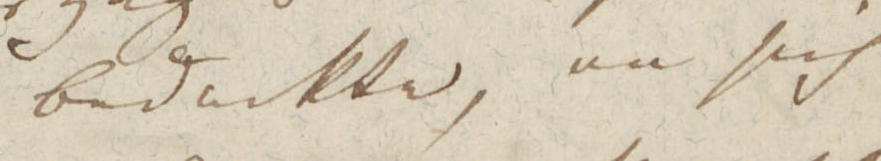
bedeckte, an sich
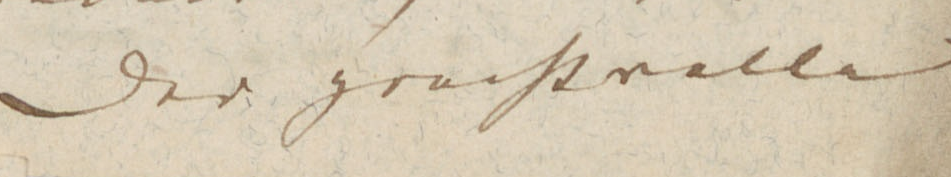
Der prachtvolle
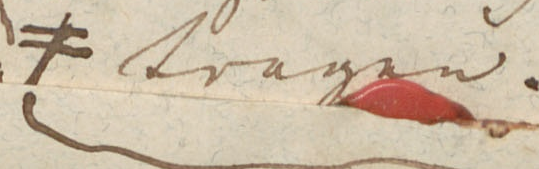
zu betrachten %
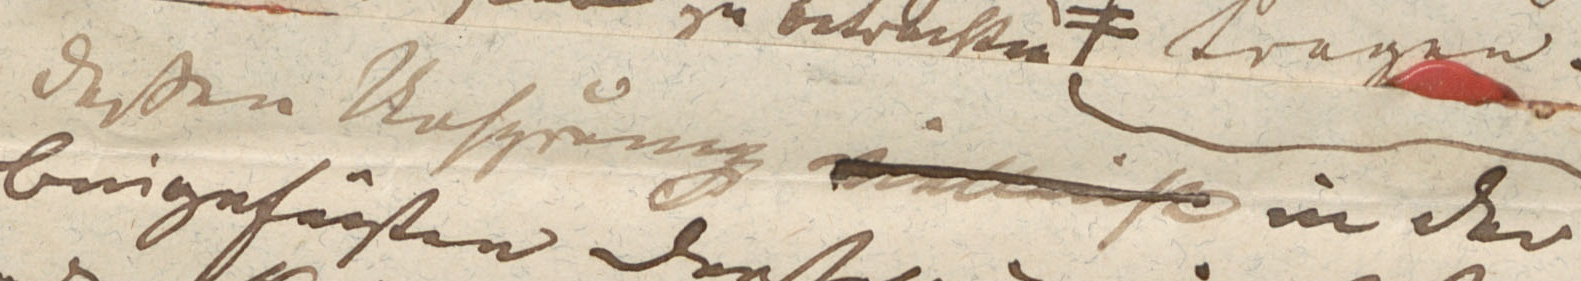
dessen Ursprung vielleicht in der
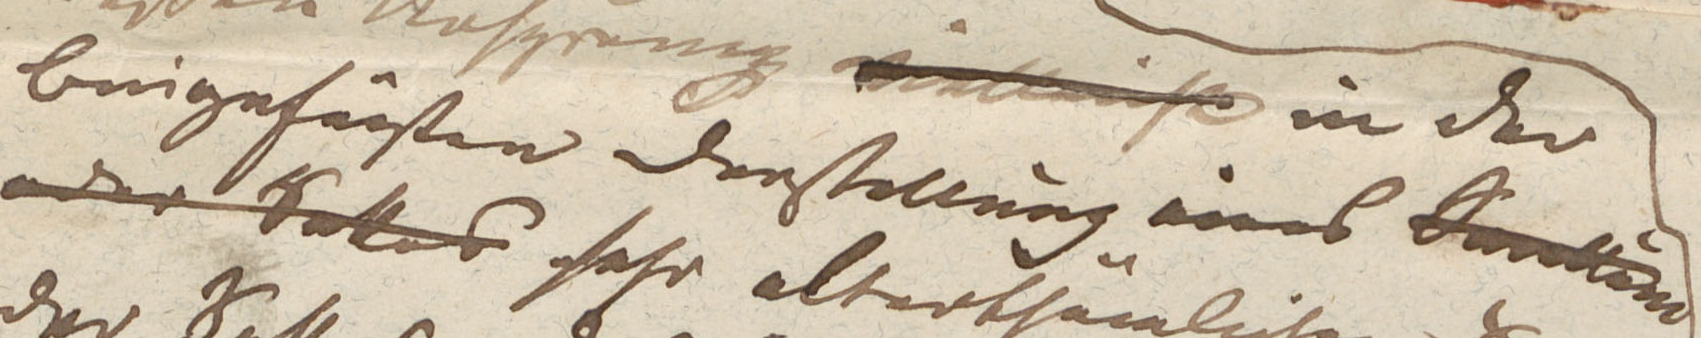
beigefügten Darstellung eines Sacellum
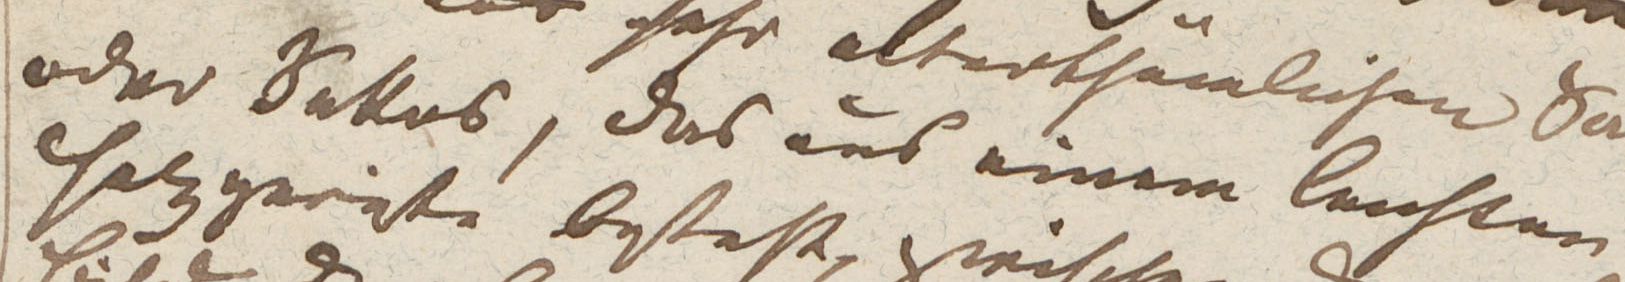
oder Sekos, das aus einem leichten
